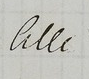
Alle
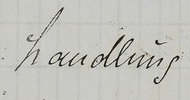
Mitglieder sind
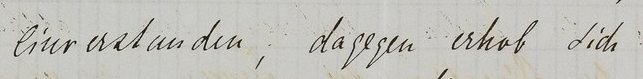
einverstanden, dagegen erhob sich
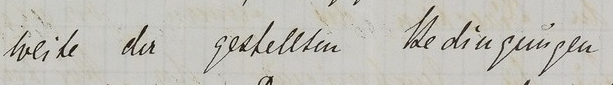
weite der gestellten Bedingungen
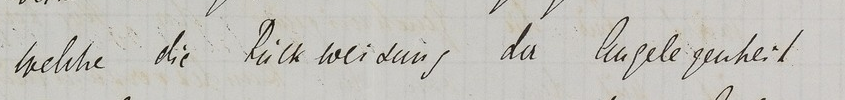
welche die Rückweisung der Angelegenheit
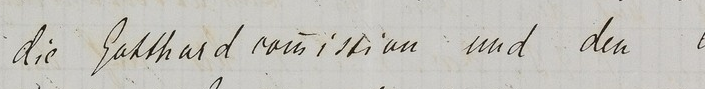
die Gotthardcommission und den
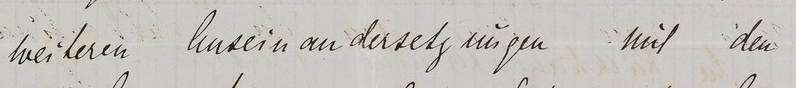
weiteren Auseinandersetzungen mit den
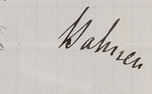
Bahnen
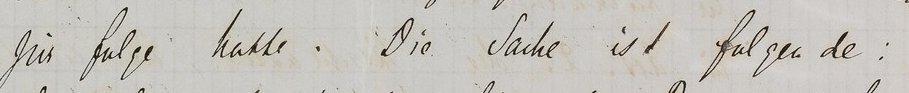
zur Folge hatte. Die Sache ist folgende:
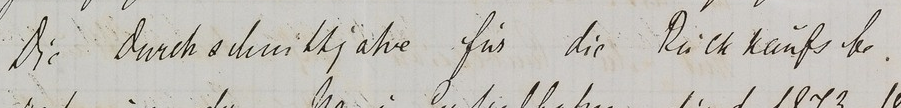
Die Durchschnittjahre für die Rückkaufsbe-
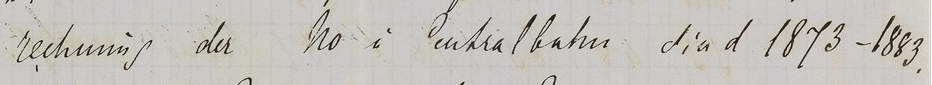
rechung der NO u Centralbahn sind 1873–1883.
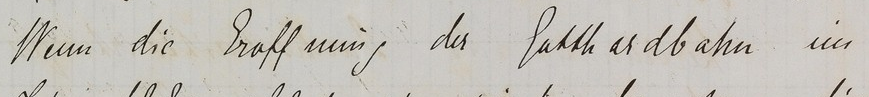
Wenn die Eröffnung der Gotthardbahn im
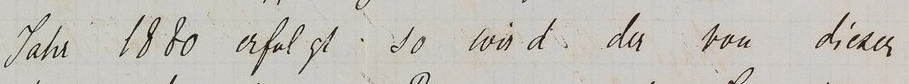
Jahr 1880 erfolgt so wird der von dieser
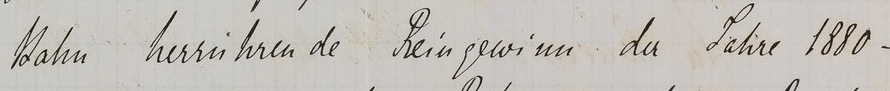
Bahn herrührende Reingewinn der Jahre 1880–
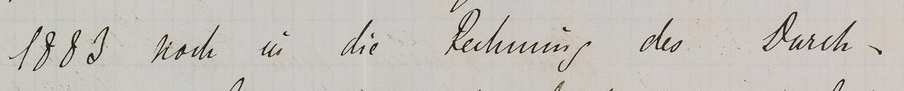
1883 noch in die Rechnung des Durch-
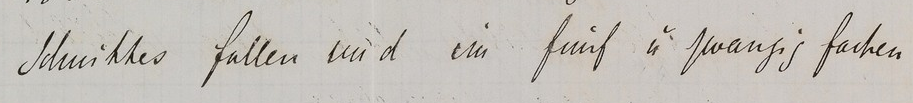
schnittes fallen und im fünf u zwanzigfachen
